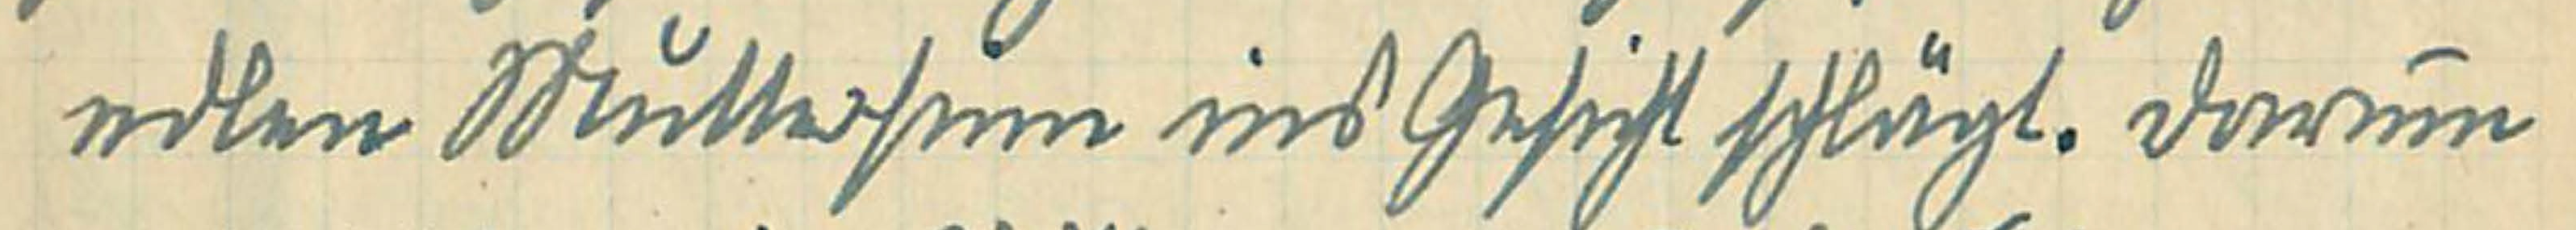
edlen Muttersinn ins Gesicht schlägt. Darum
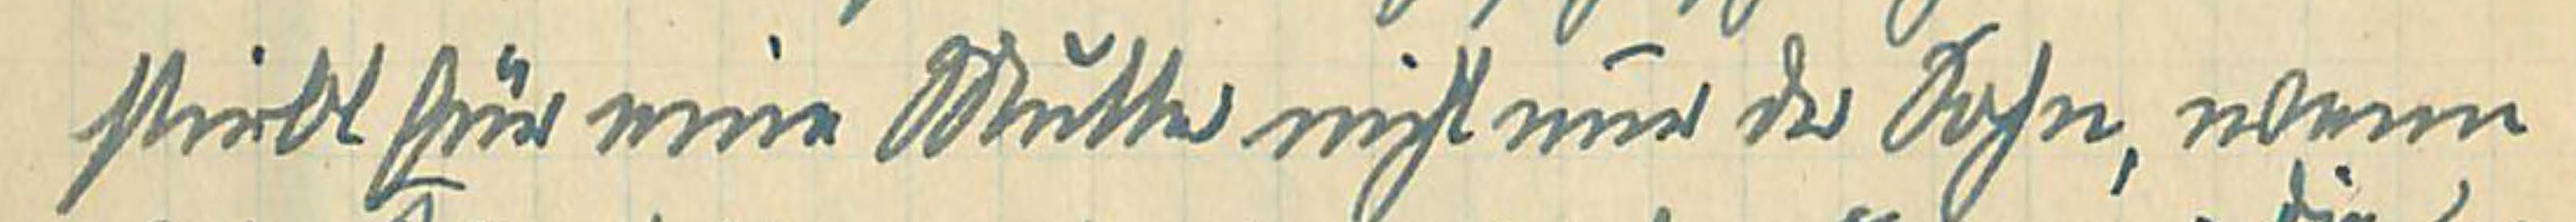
stirbt für eine Mutter nicht nur der Sohn, wenn
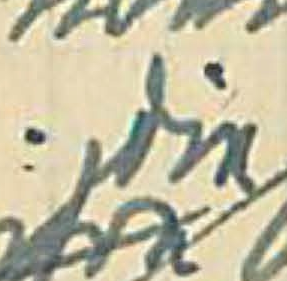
die
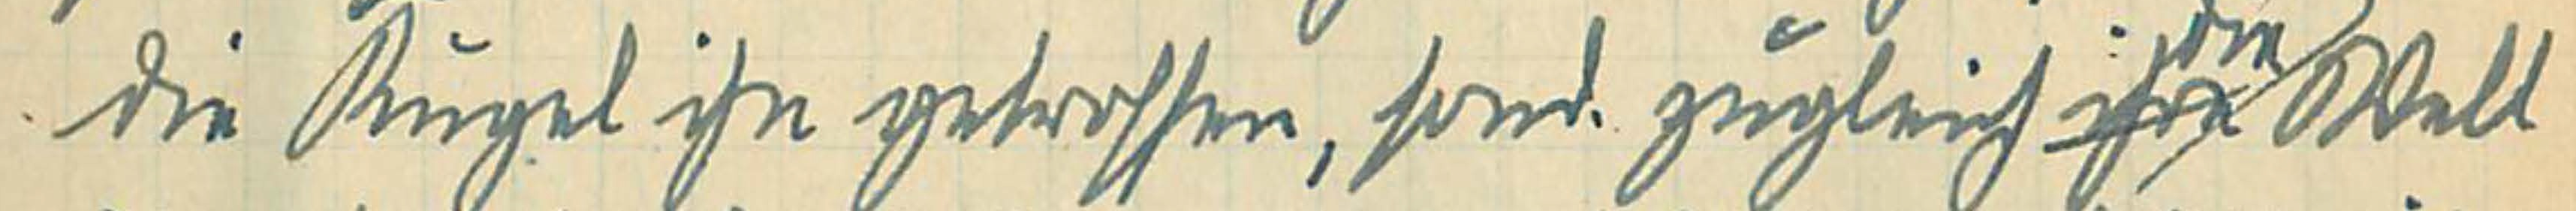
die Kugel ihn getroffen, sond. zugleich ihre Welt
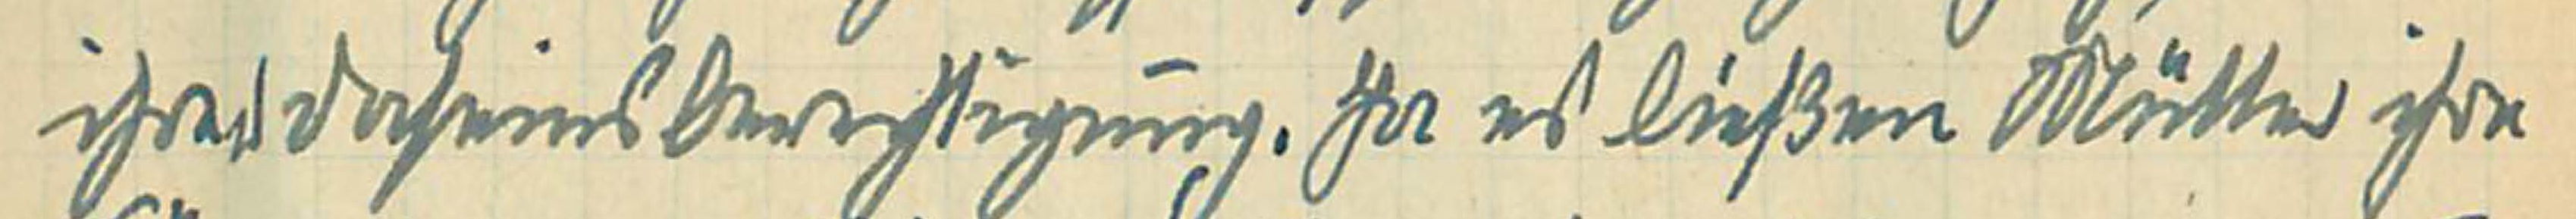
ihrer Daseinsberechtigung. Ja es ließen Mütter ihre
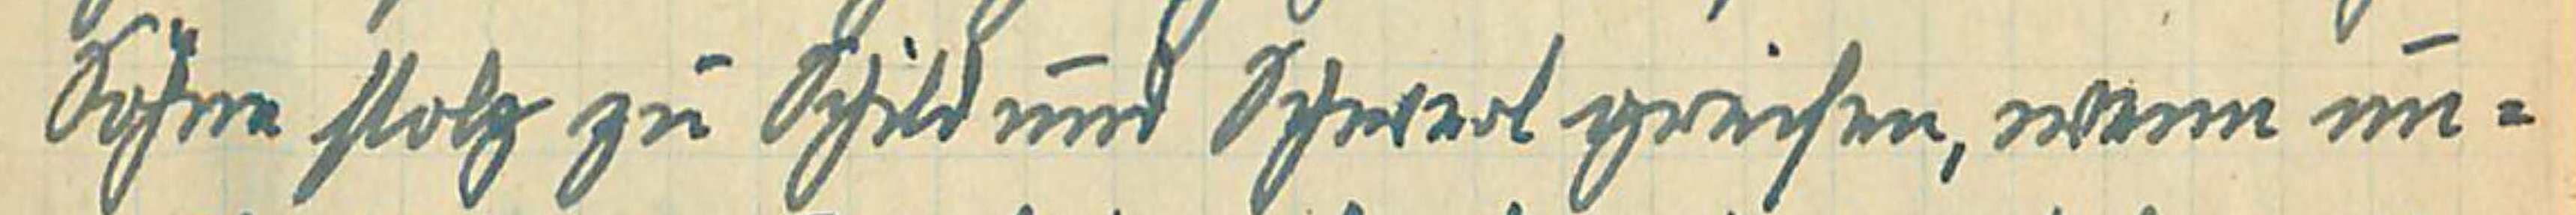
Söhne stolz zu Schild und Schwert greifen, wenn un-
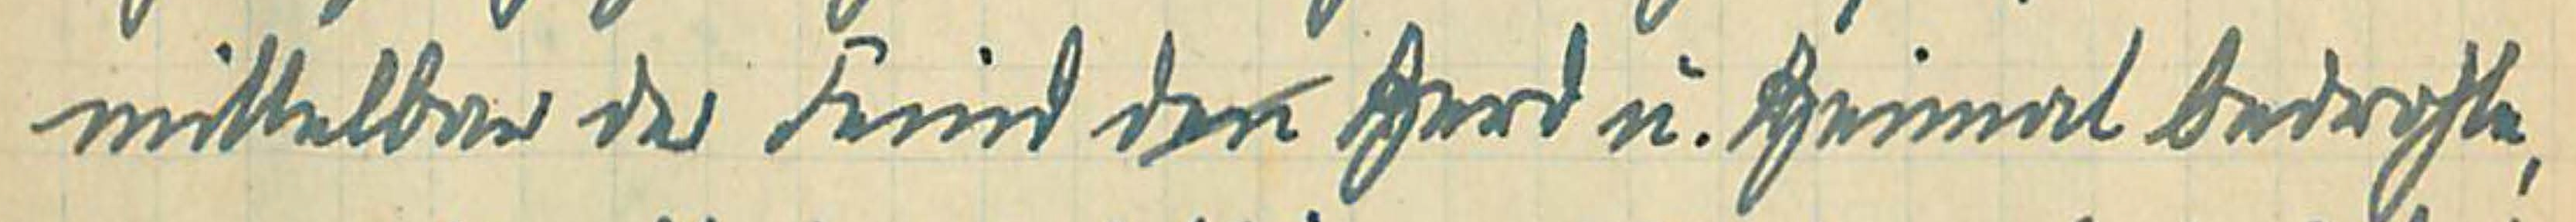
mittelbar der Feind den Herd u. Heimat bedrohte,
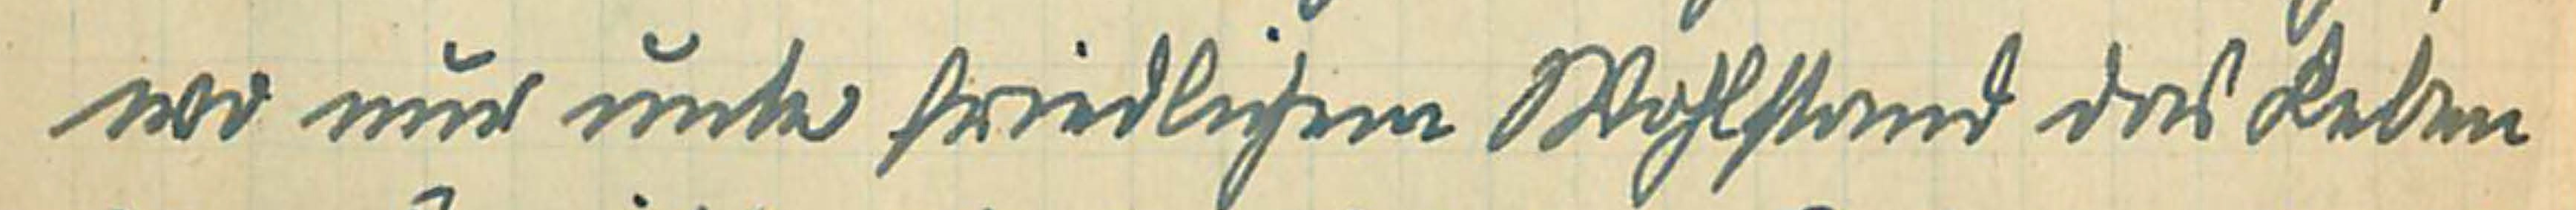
wo nur unter friedlichem Wohlstand das Leben
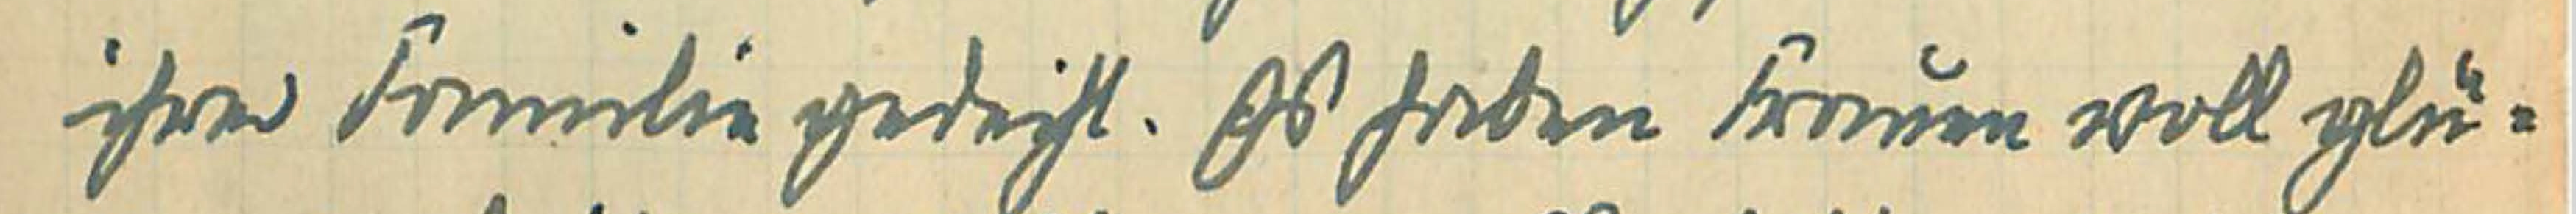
ihrer Familie gedeiht. Es haben Frauen voll glü-
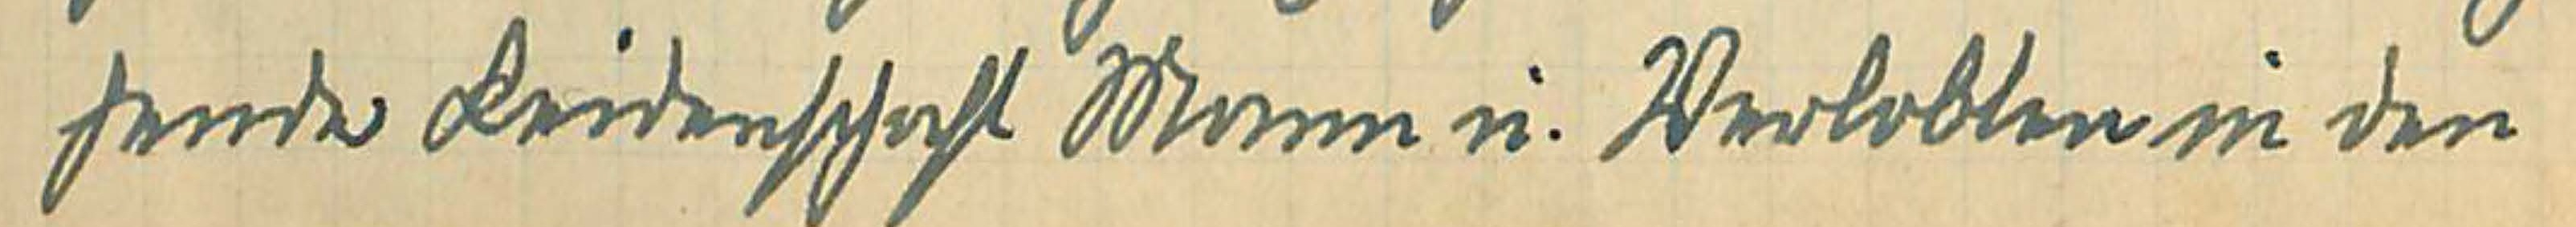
hender Leidenschaft Mann u. Verlobten in den
